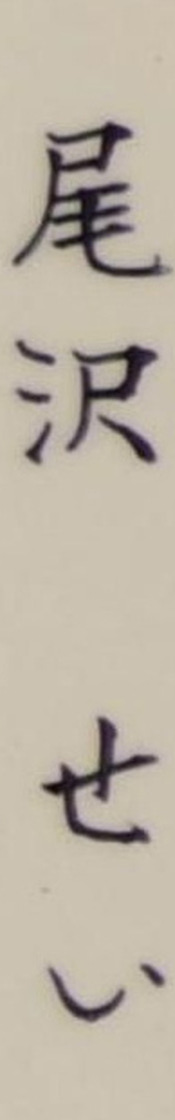尾沢せい

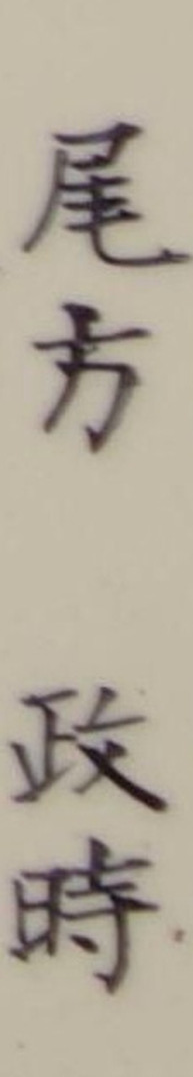尾方政時
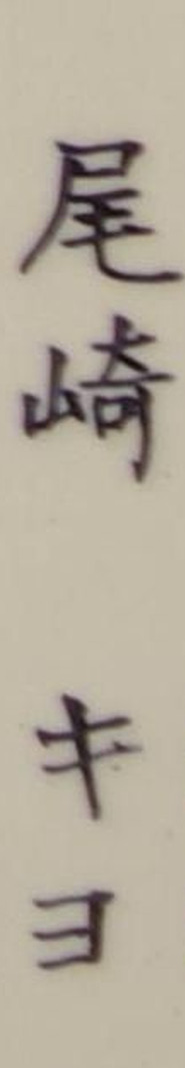尾崎キヨ
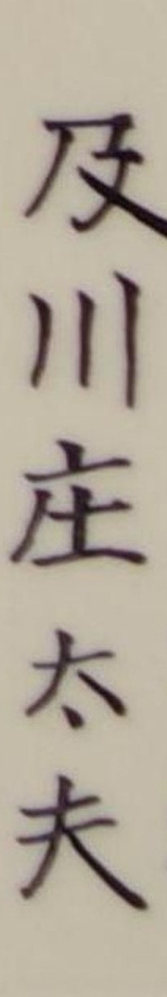及川庄太夫
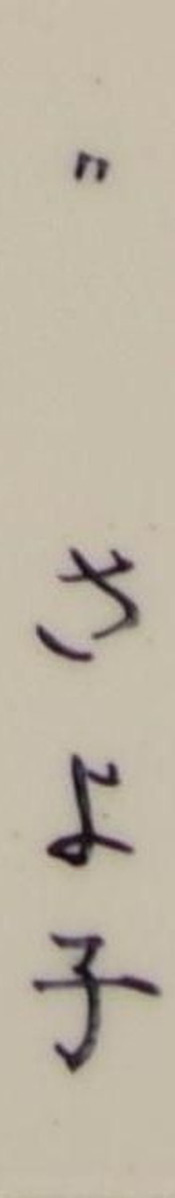さよ子
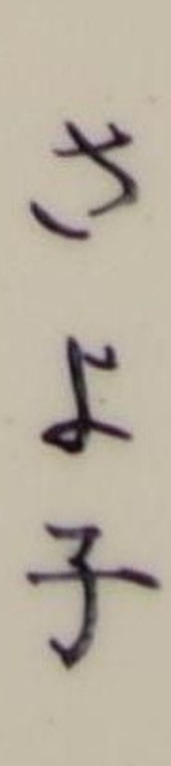さよ子
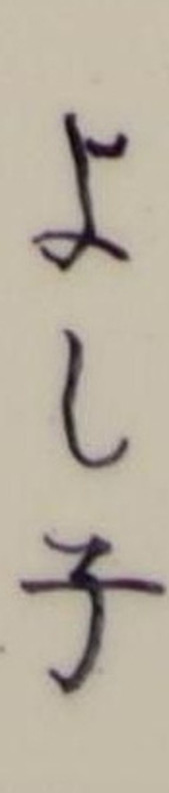よし子
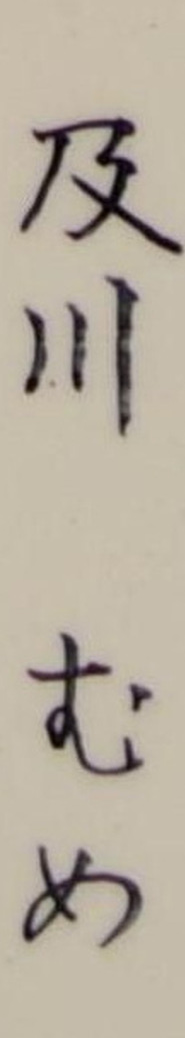及川むめ
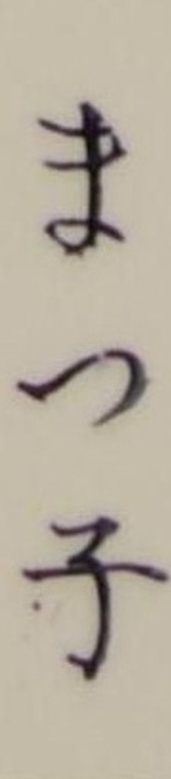まつ子
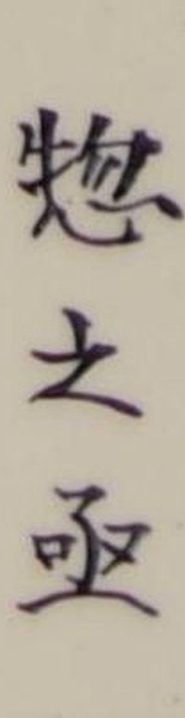惣之丞
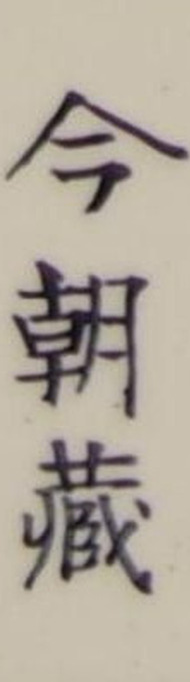今朝蔵
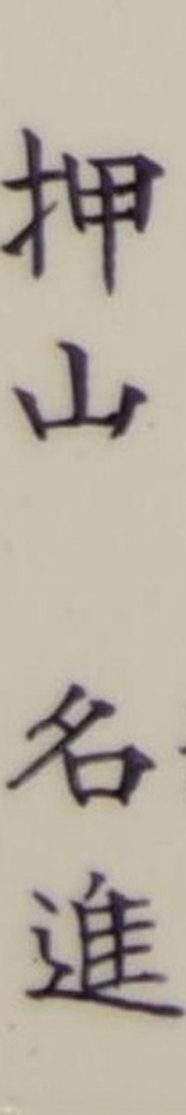押山名進
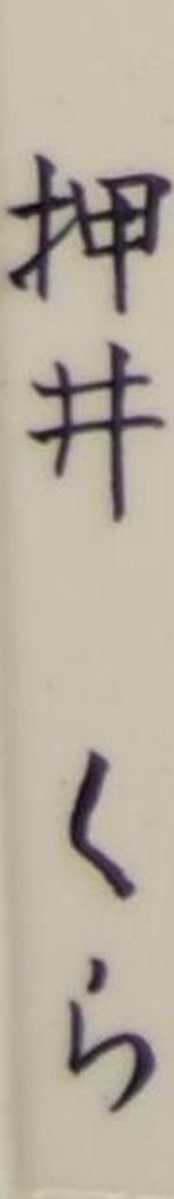押井くら

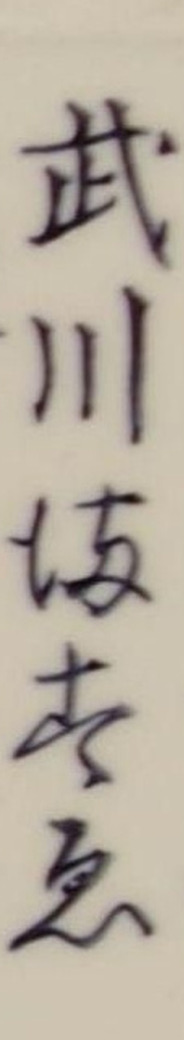武川ますえ
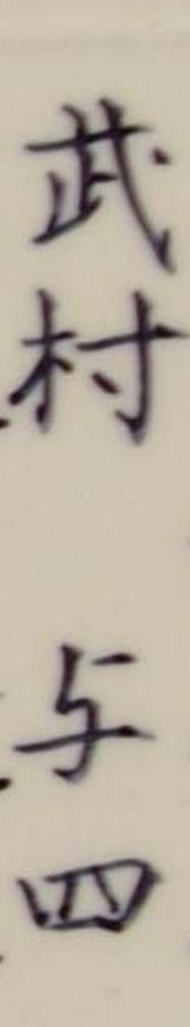武村与四
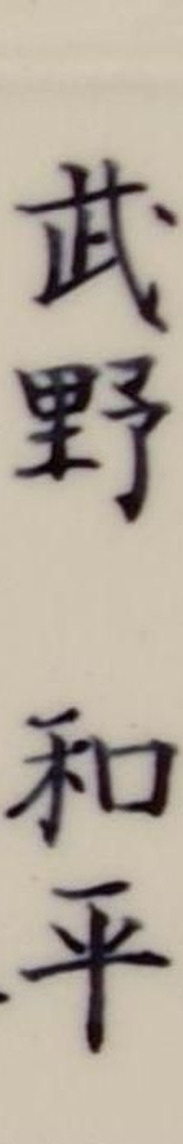武野和平
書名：E~L
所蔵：高野山金剛峯寺
